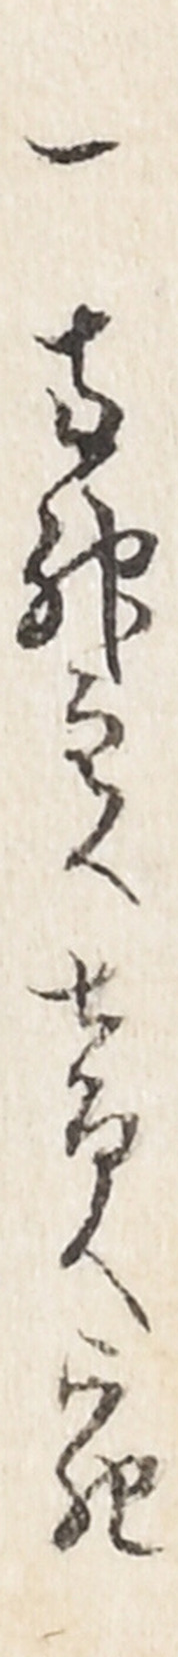一両神主人七百人宛
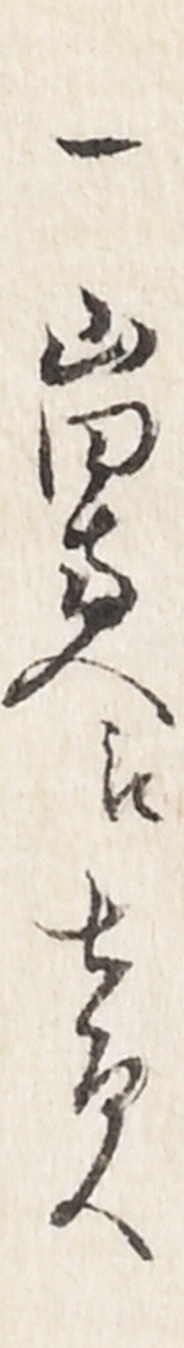一山田両人江七百人
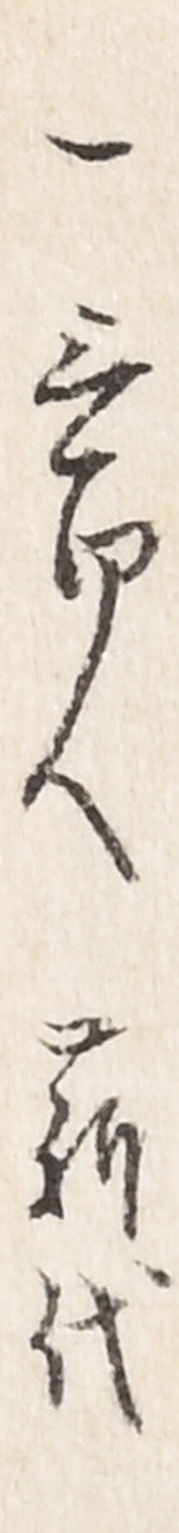一三百人薪代

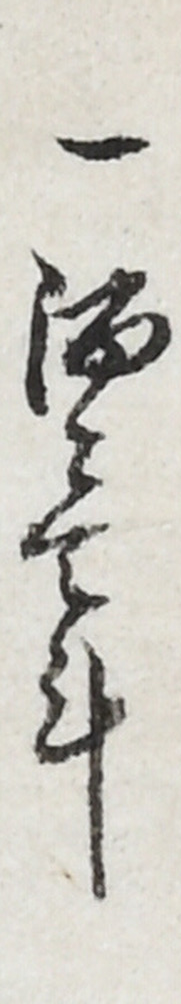一酒壱斗
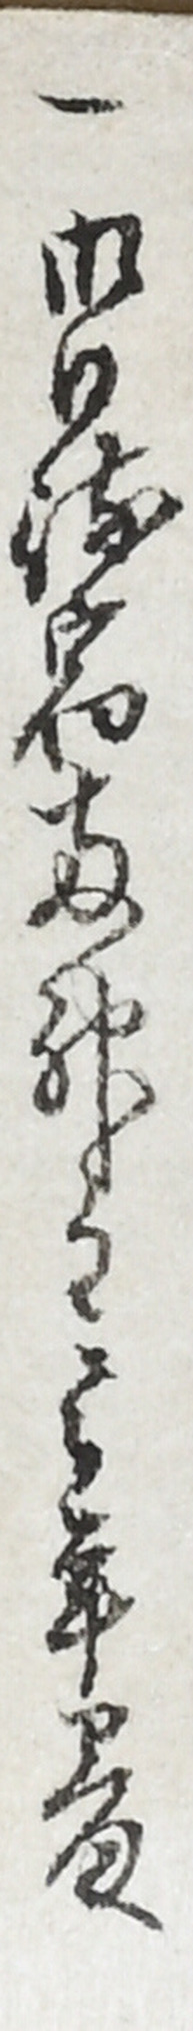一御日待宿両神主ニ而年番
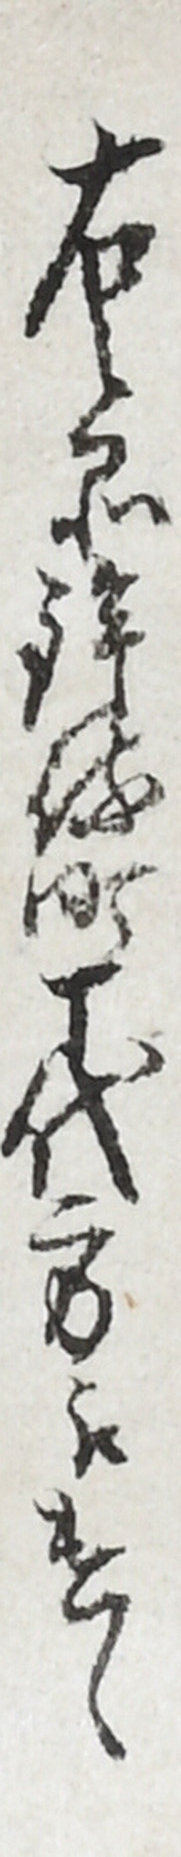右之品鉾持町丁代方江遣候
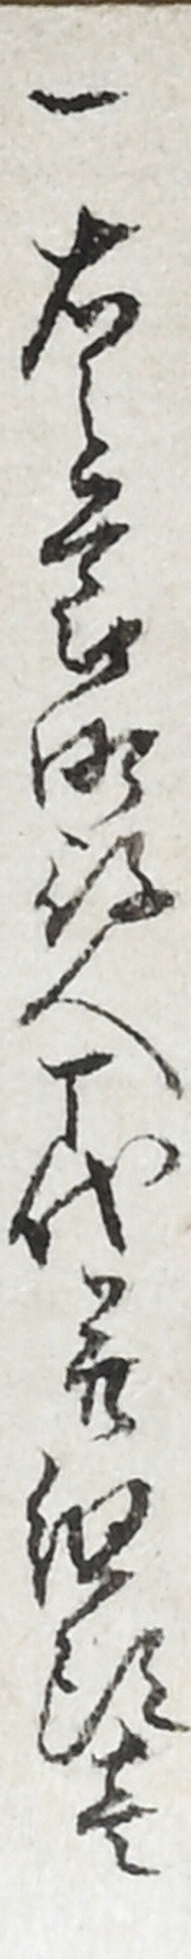一右之節町役人丁代并組頭壱
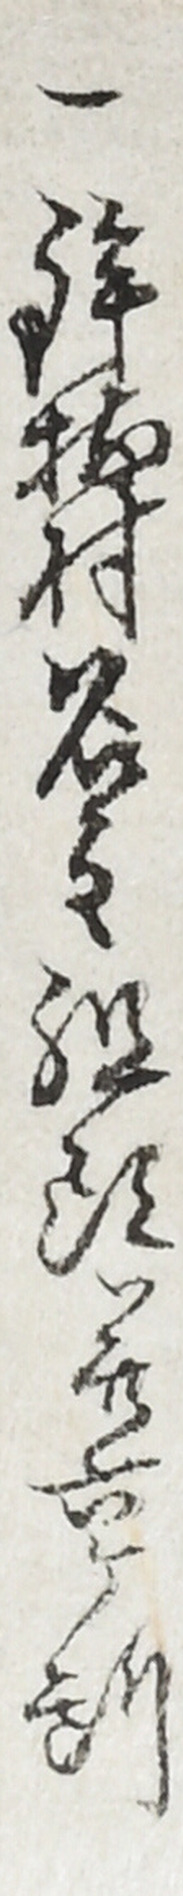一鉾持村名主組頭幷六ケ所
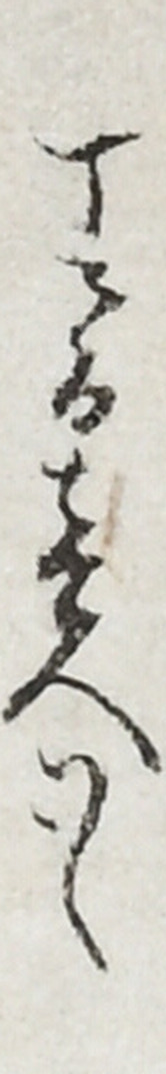丁ニ而壱人ツヽ
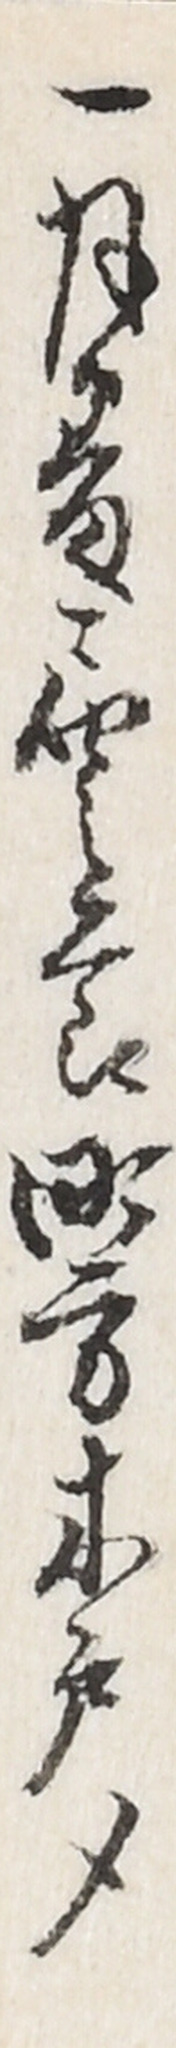一月番届之節町方木戸〆
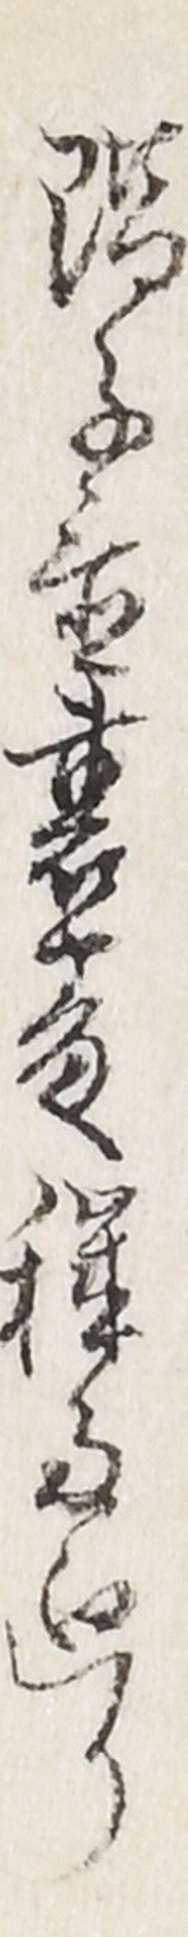階子置裏番ハ穢多廻り
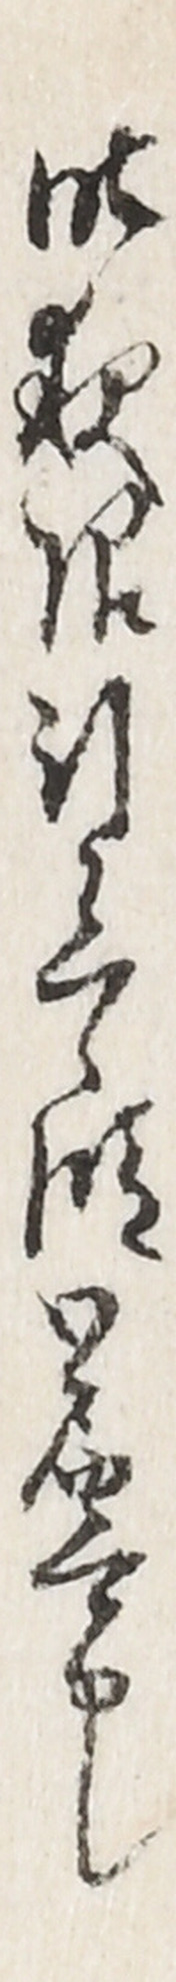昨夜限引上候段御届可申候
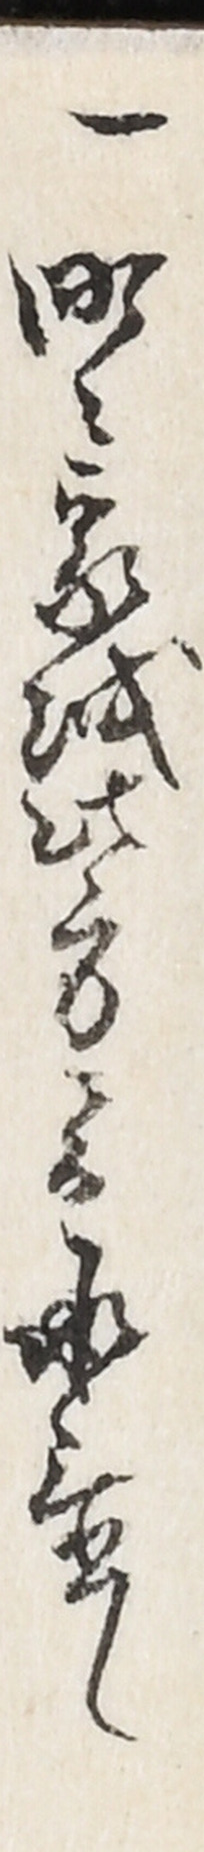一町々家越此方ニ而承置候
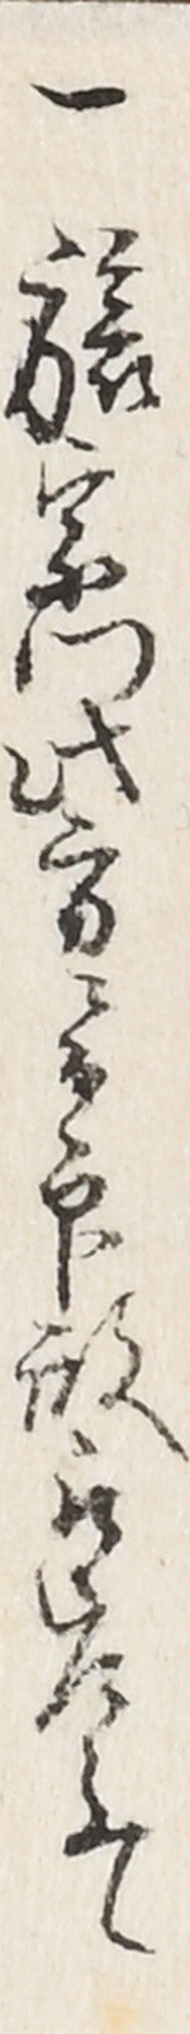一旅宗門此方ニ而印形被差上候
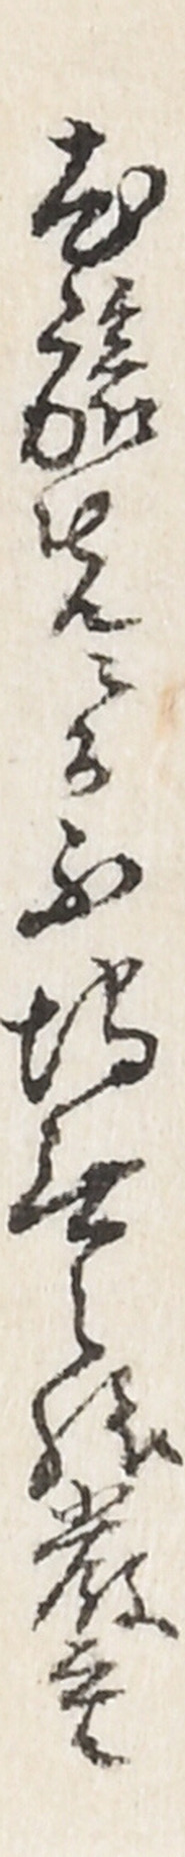尤旅先ニ而不埒無之様厳重
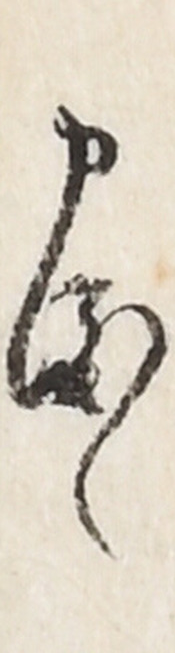申渡候
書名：年内行事懐中録
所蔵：伊那市立高遠町図書館・合同会社AMANE
